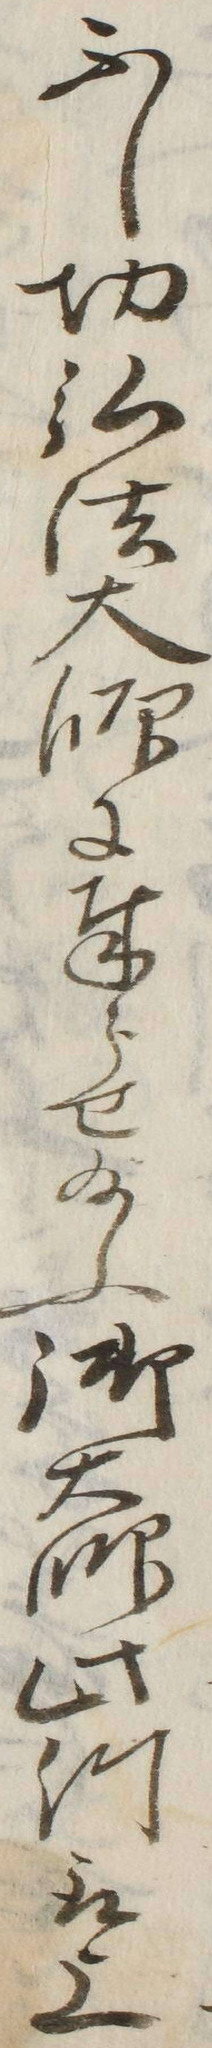ふし切弘法大師に奉らせ給ふ御大師此竹取上
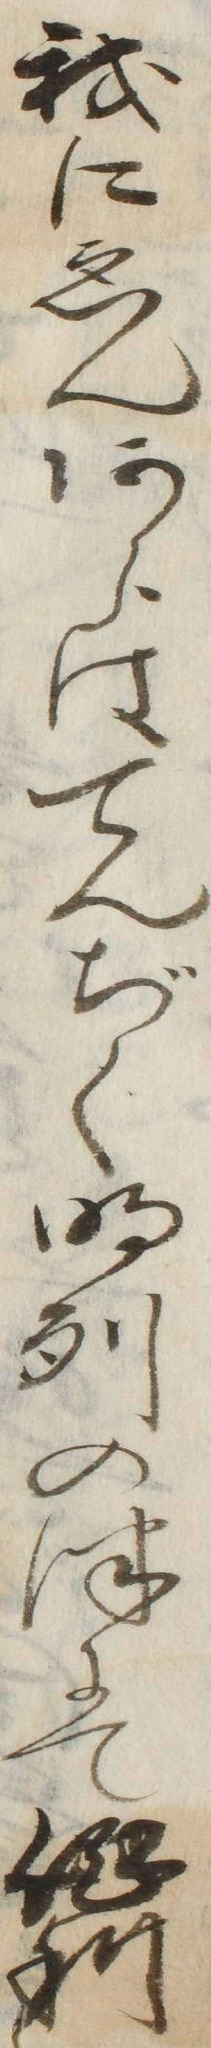我にゑんあらはてんぢく明州の津にて作り
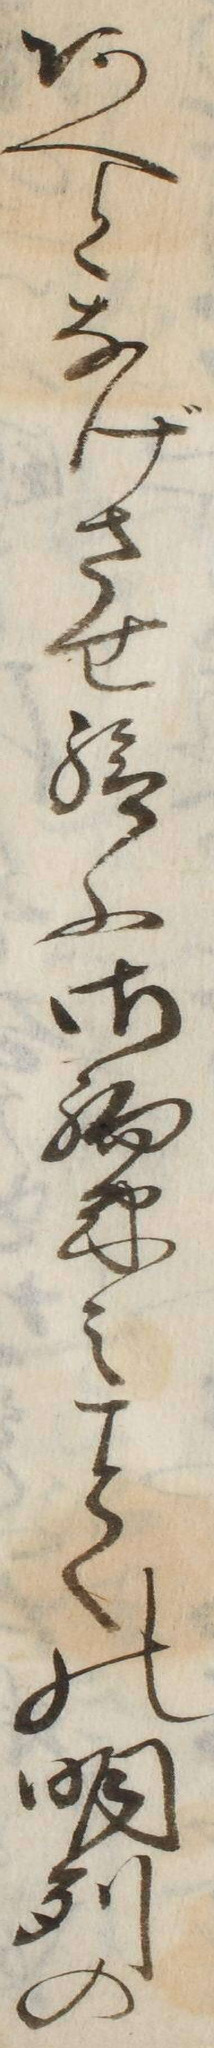あへとなけさせ給ふ御約束之ことくの明州の
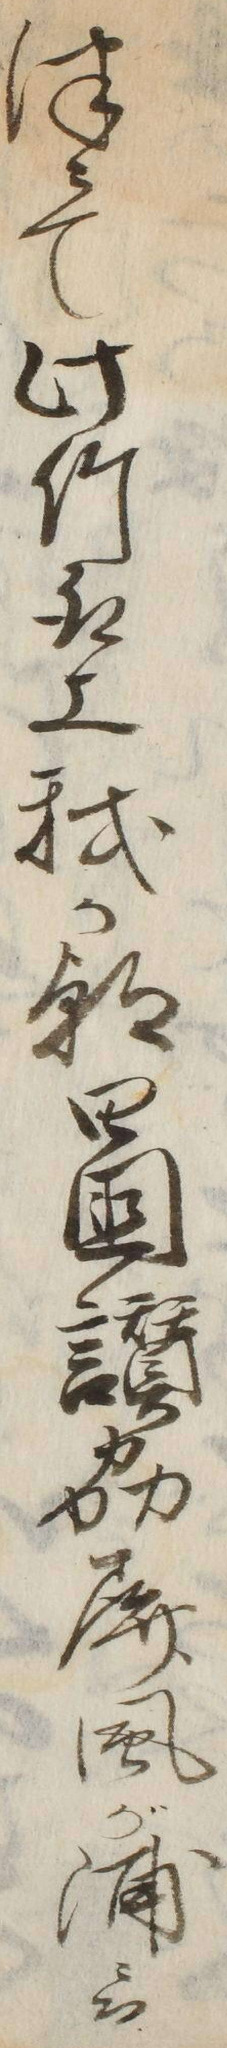津にて此竹取上我か朝四国讃州屏風か浦にて
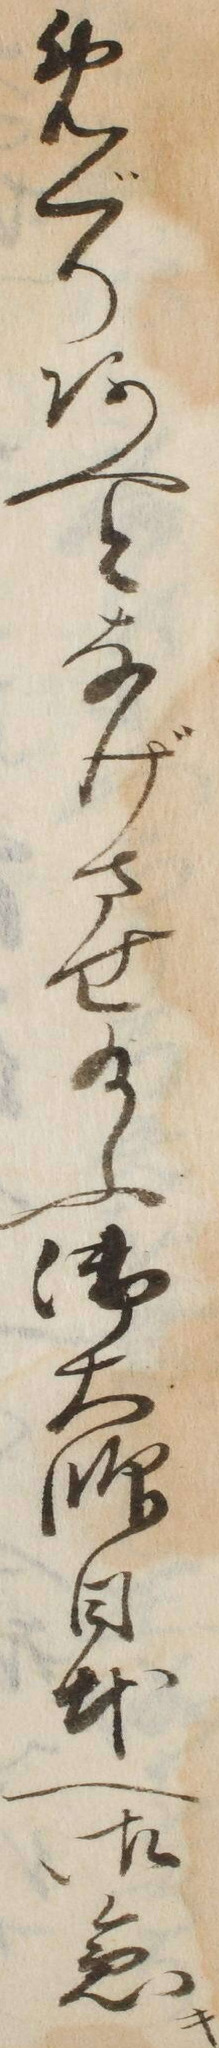めぐりあへとなげさせ給ふ御大師日本へ御急き
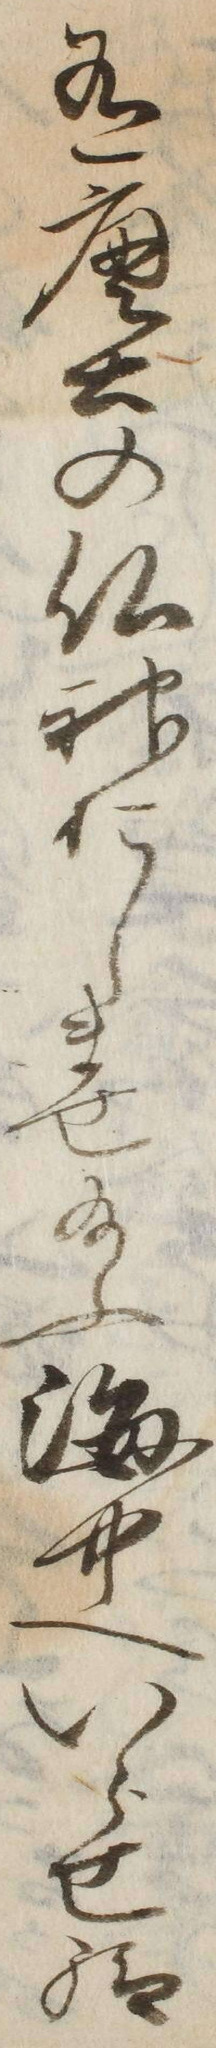有唐土の仏神おしませ給ふ海中へいらせ給
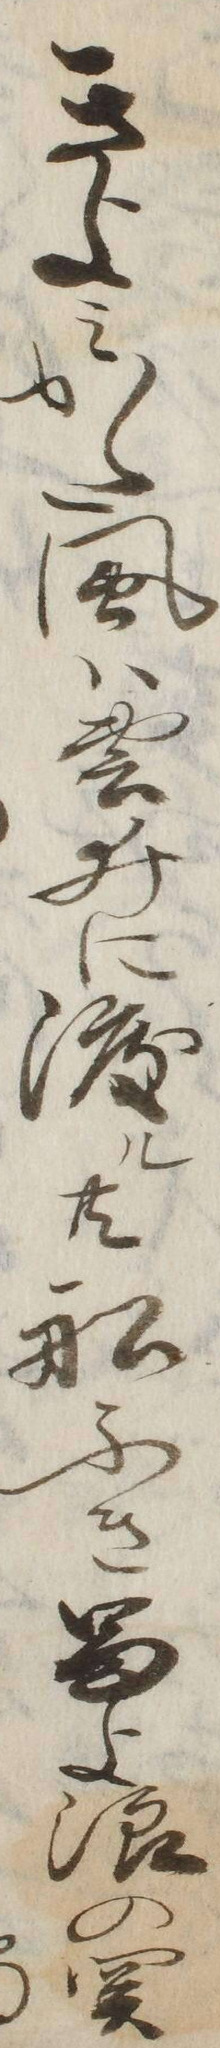きよみかた風は雲井に渡る共船ふき留よ浪の関守
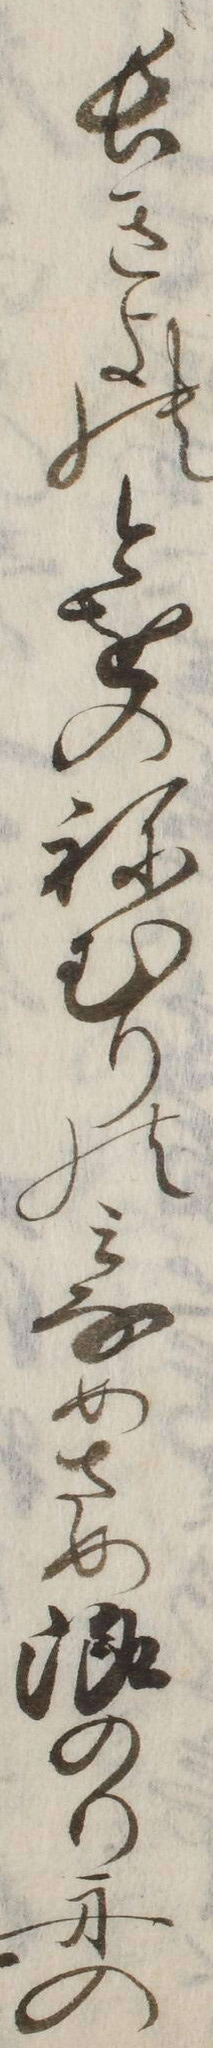長きよのとをのねむりのみなめさめ浪のり舟の
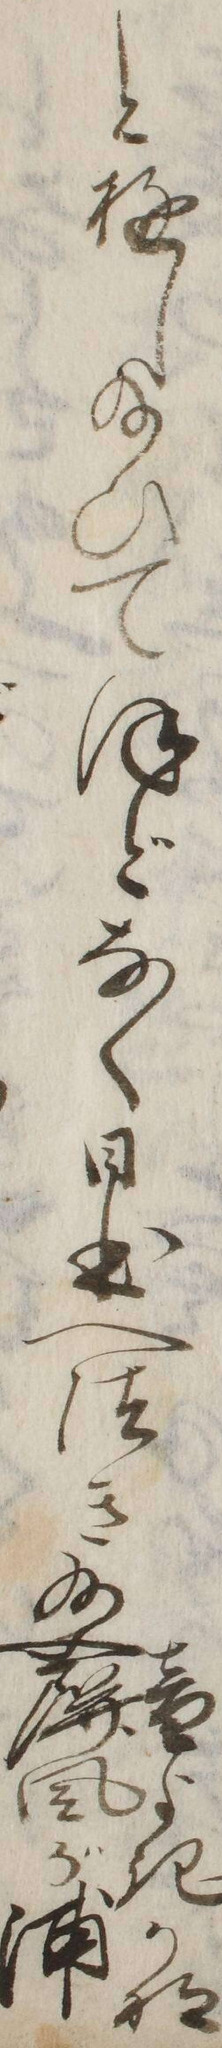しと遊し給ひてほどなく日本へつき給ふ屏風が浦
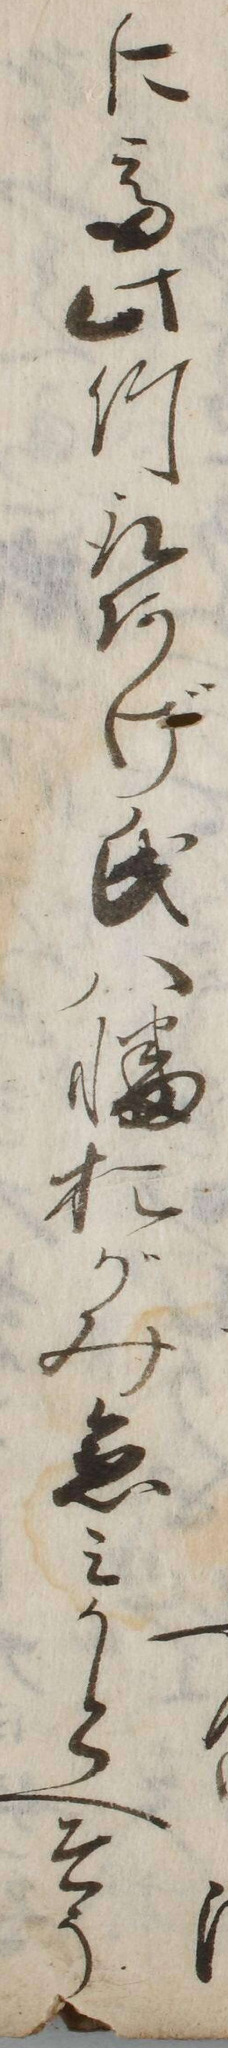にて此竹取あげ氏八幡おがみ急みかとへそう
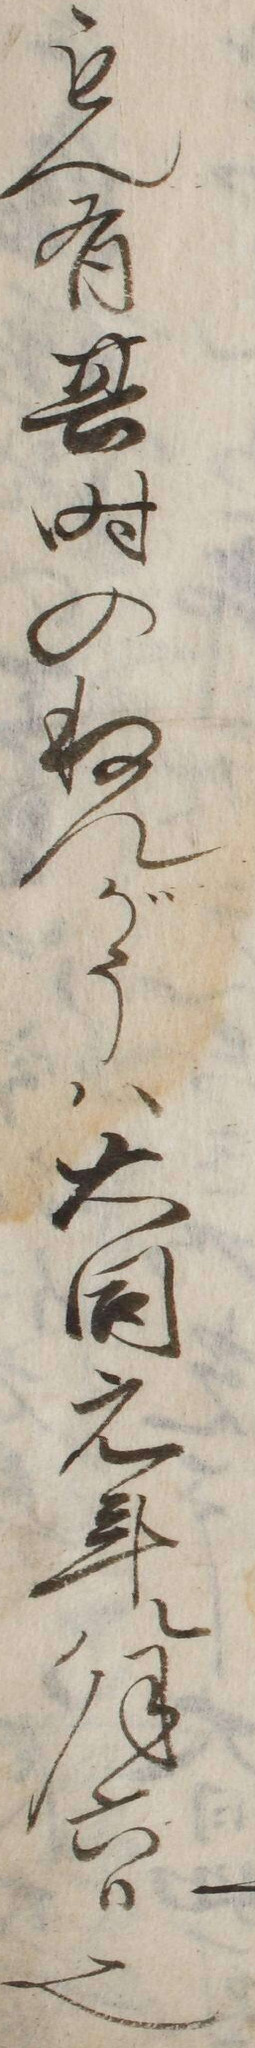もん有其時のねんがうは右同元年八月六日也

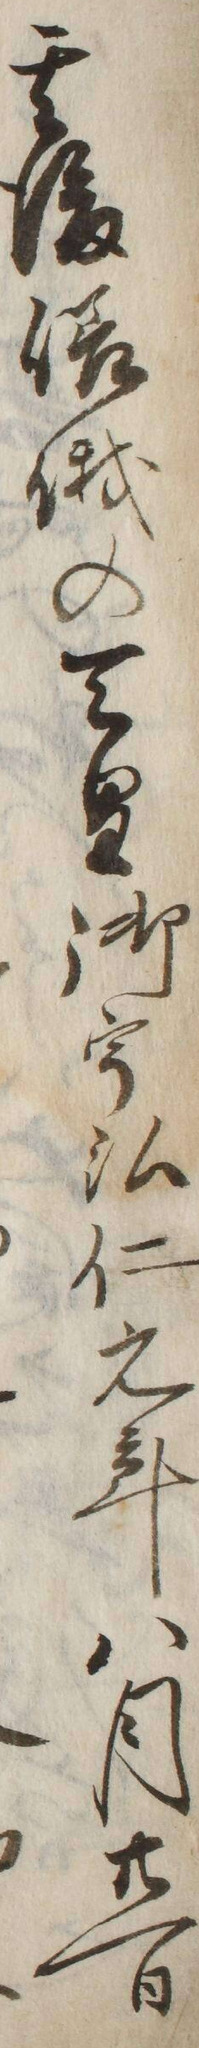其後嵯峨の天皇御宇弘仁元年八月廿一日
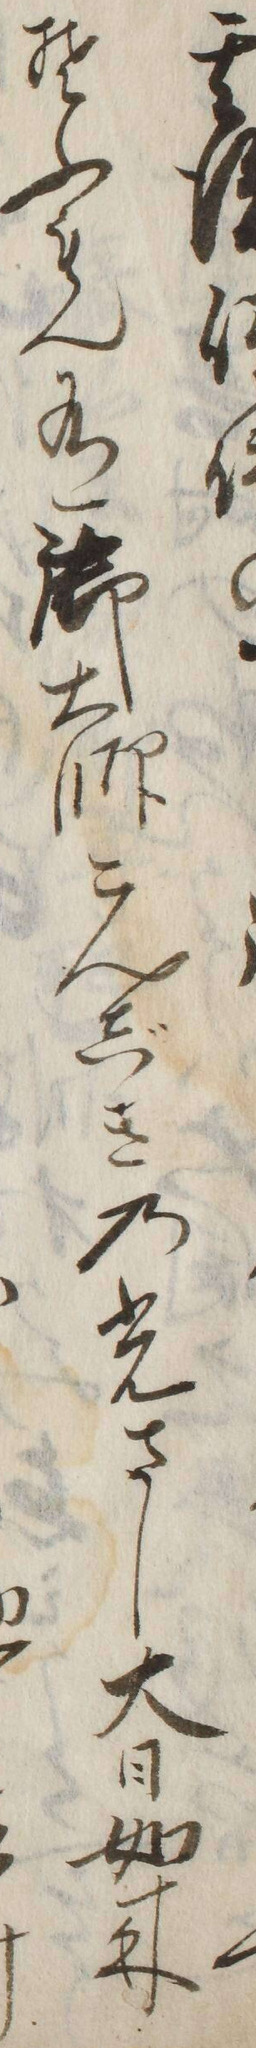そふもん有一御大師こんじきの光さし大日如来
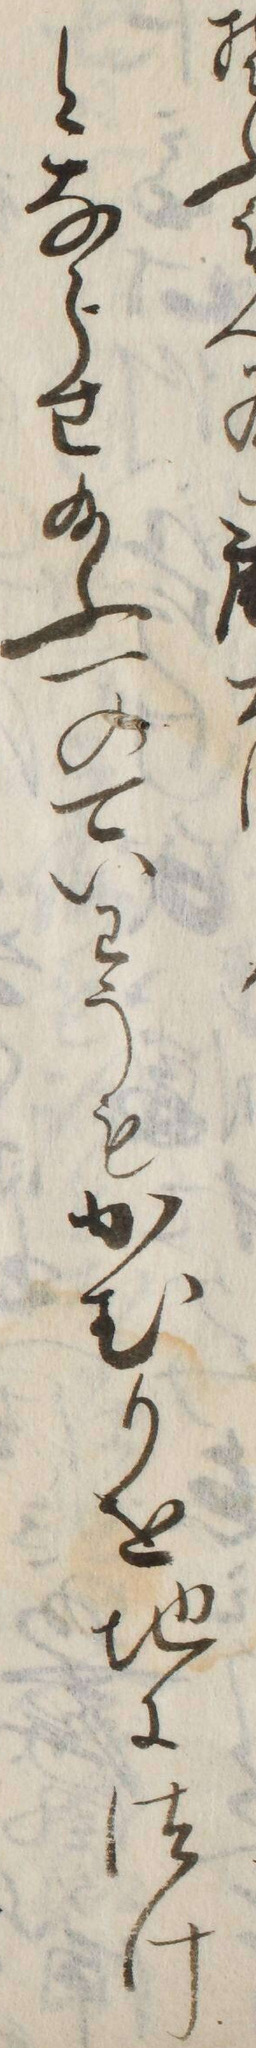とならせ給ふ一のていわうもかむりを地につけ
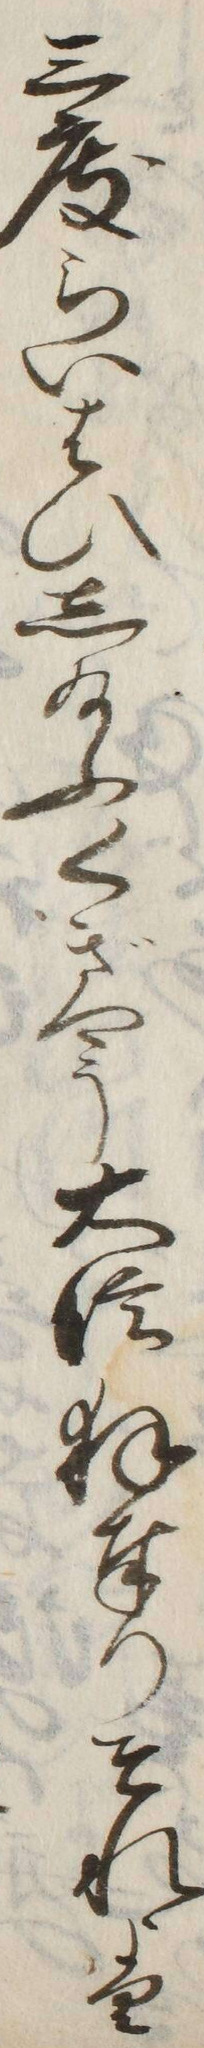三度らいはひし給ふくぎやう大臣拝奉りそれより
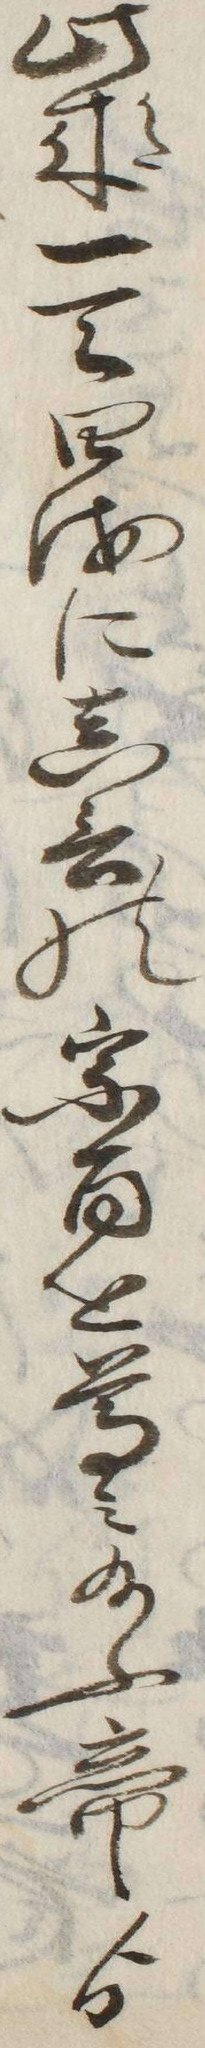此来一天四海に真言の宗百を尊み給ふ帝より
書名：奉弘法大師御傳記
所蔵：国文学研究資料館
